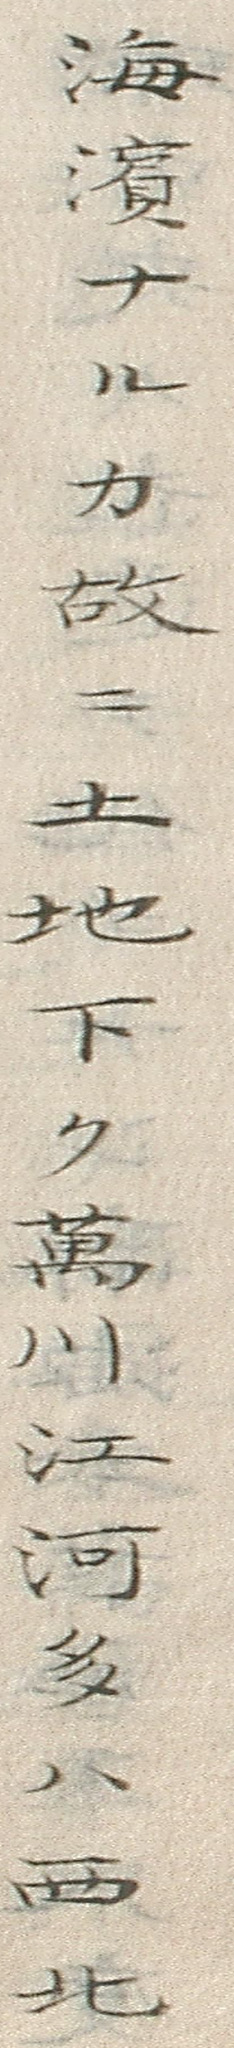海浜ナルカ故ニ土地下ク万川江河多ハ西北
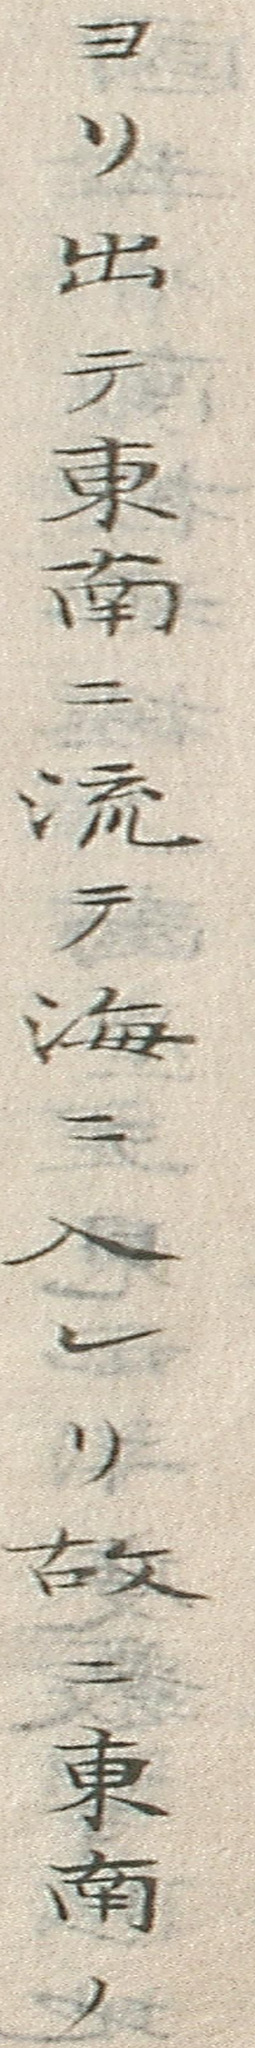ヨリ出テ東南ニ流テ海ニ入レリ故ニ東南ノ
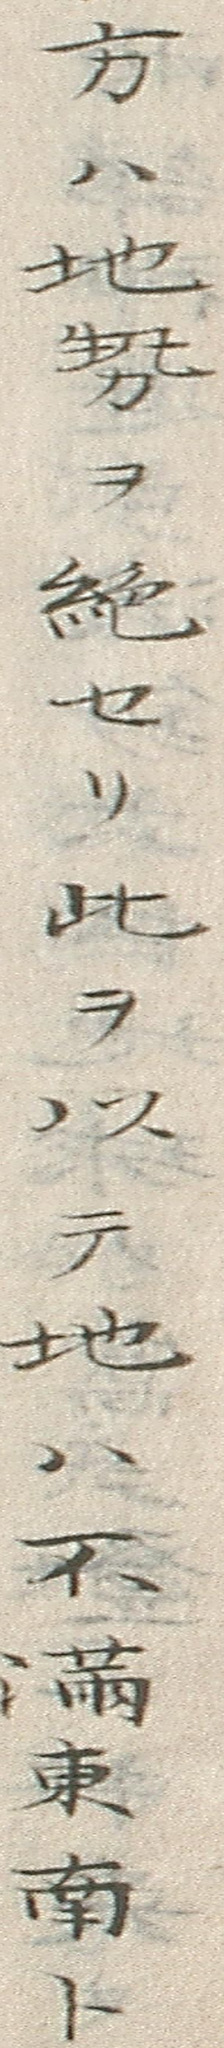方ハ地勢ヲ絶セリ此ヲ以テ地ハ不満東南ト
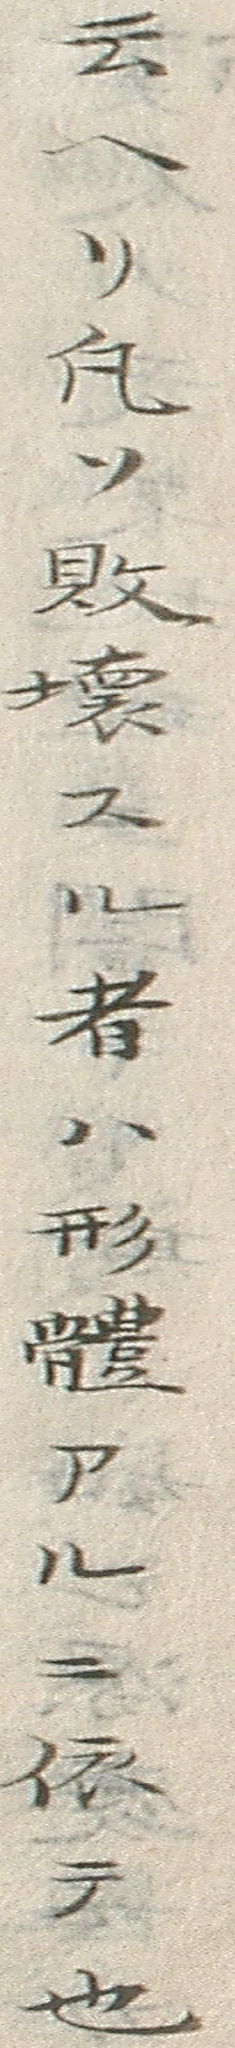云ヘリ凡ソ敗壊スル者ハ形体アルニ依テ也
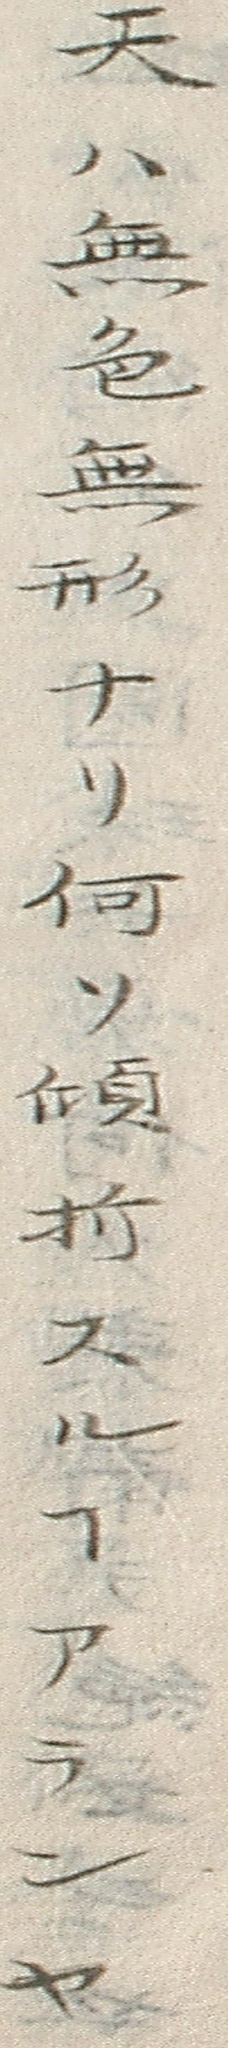天ハ無色無形ナリ何ソ傾折スルコトアランヤ

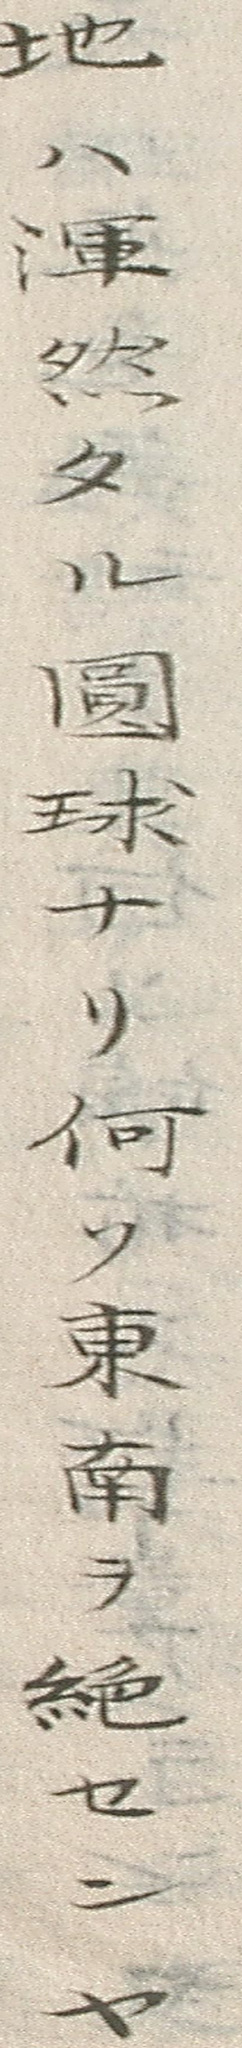地ハ渾然タル円球ナリ何ソ東南ヲ絶センヤ
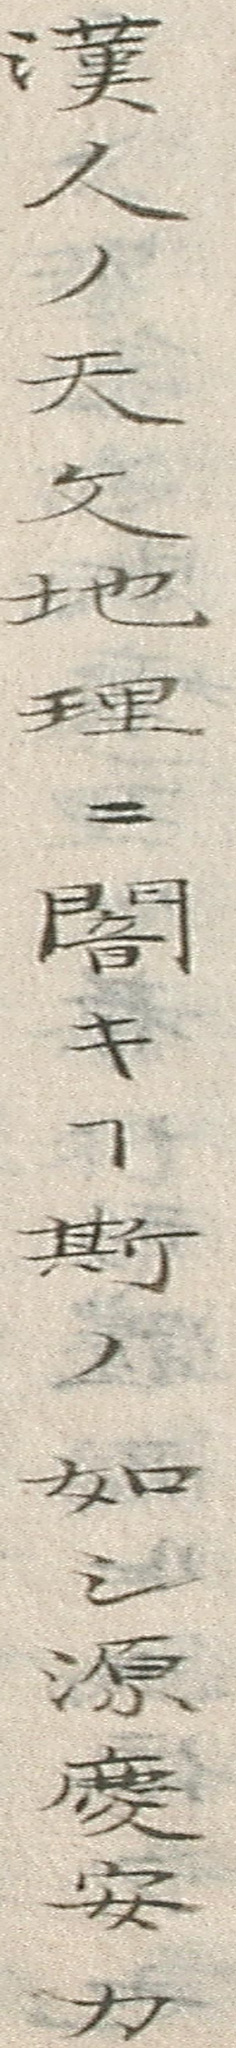漢人ノ天文地理ニ闇キコト斯ノ如シ源慶安カ
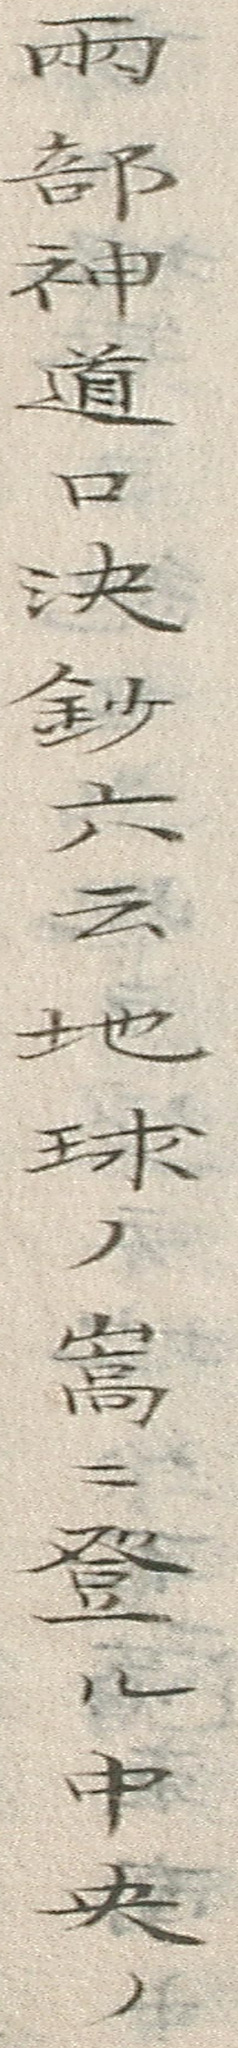両部神道口決鈔六云地球ノ嵩ニ登ル中央ノ
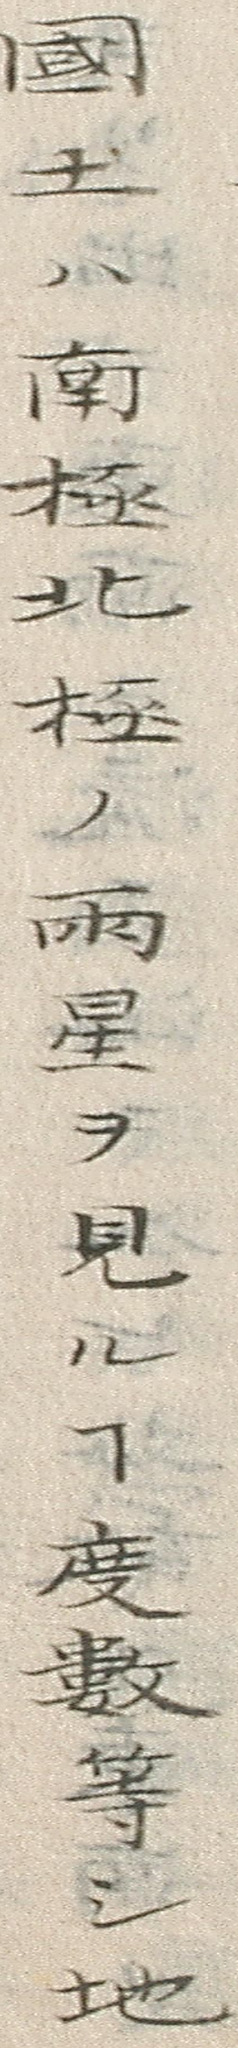国土ハ南極北極ノ両星ヲ見ルコト度数等シ地
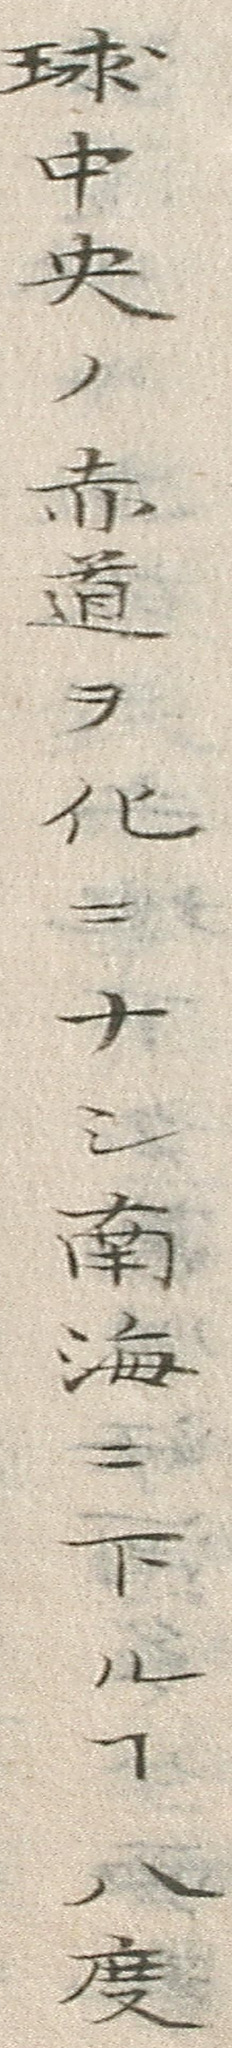球中央ノ赤道ヲ化ニナン南海ニ下ルコト八度
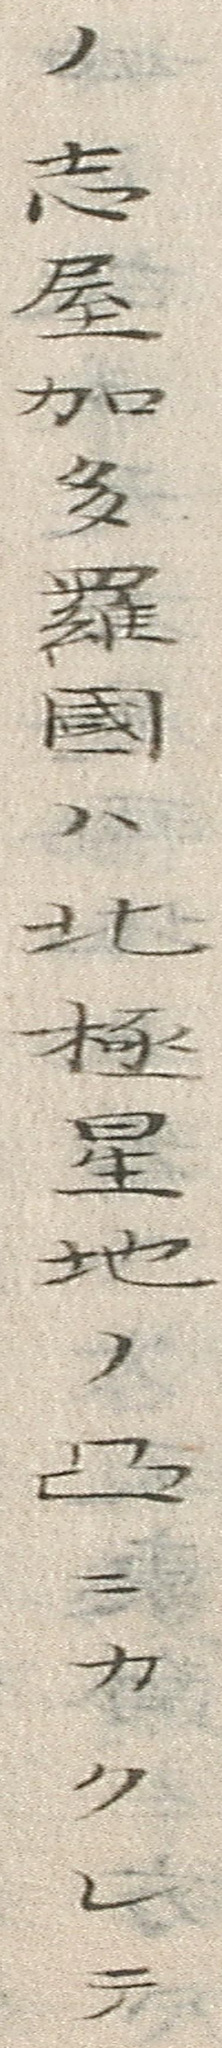ノ志屋加多羅国ハ北極星地ノ凸ニカクレテ
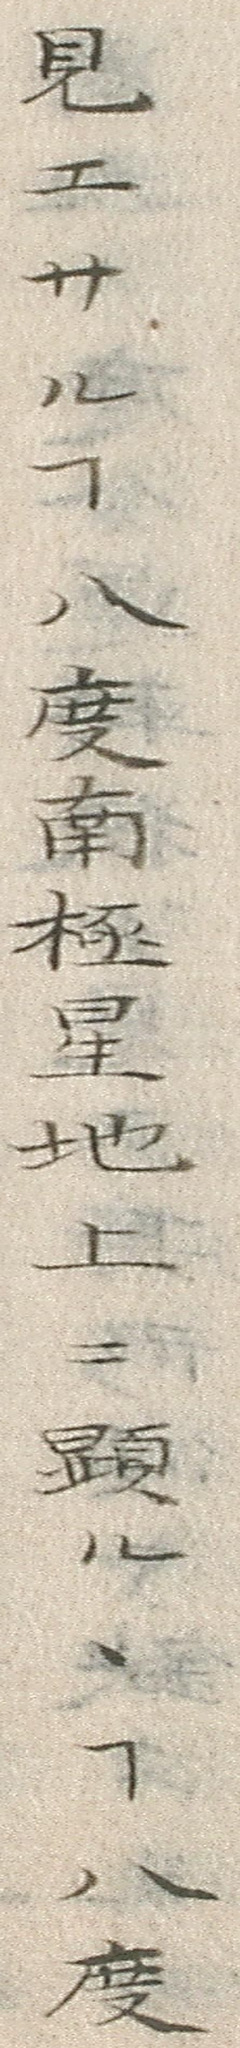見エサルコト八度南極星地上ニ顕ルヽコト八度
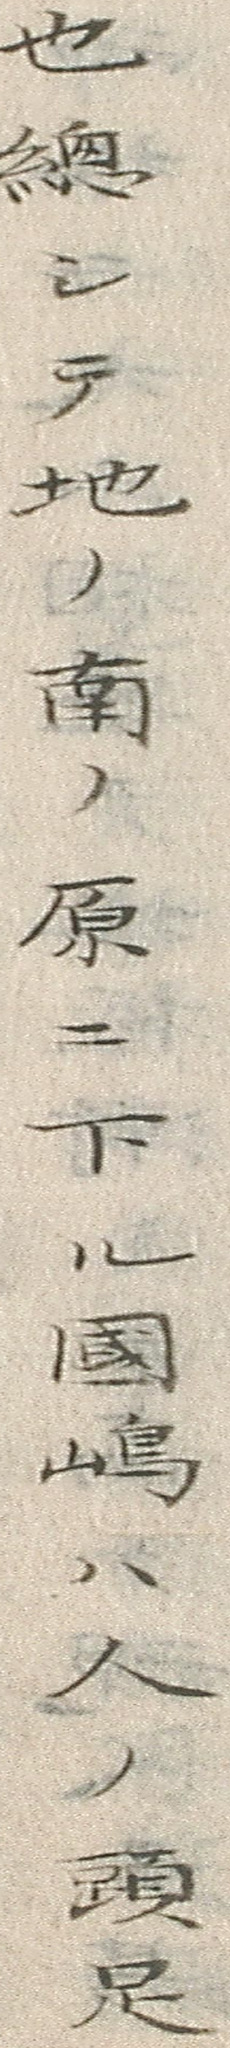也総シテ地ノ南ノ原ニ下ル国嶋ハ人ノ頭足
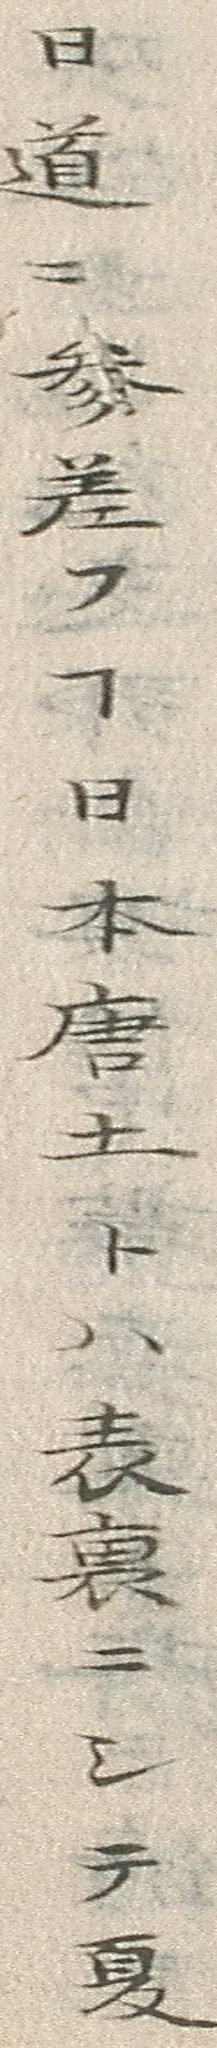日道ニ参差フコト日本唐土トハ表裏ニシテ夏
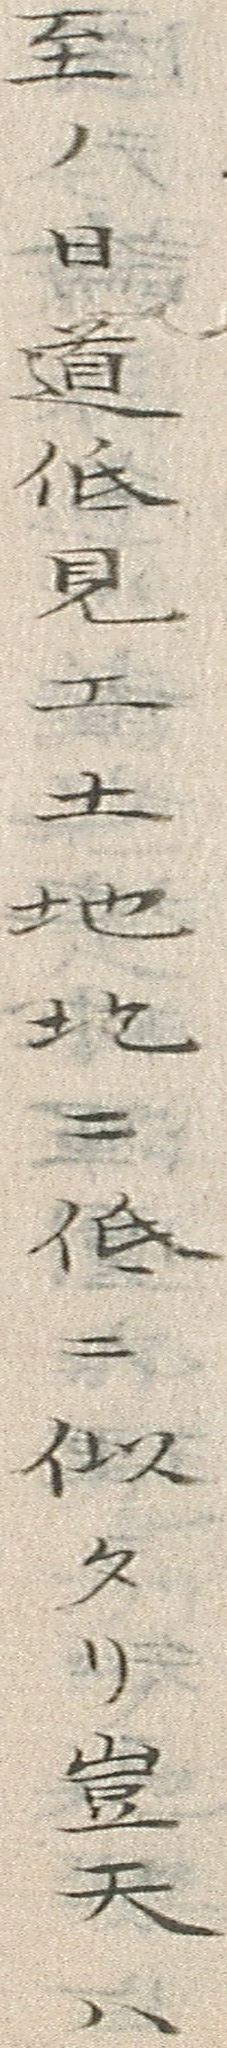至ノ日道低見エ土地北ニ低ニ似タリ豈天
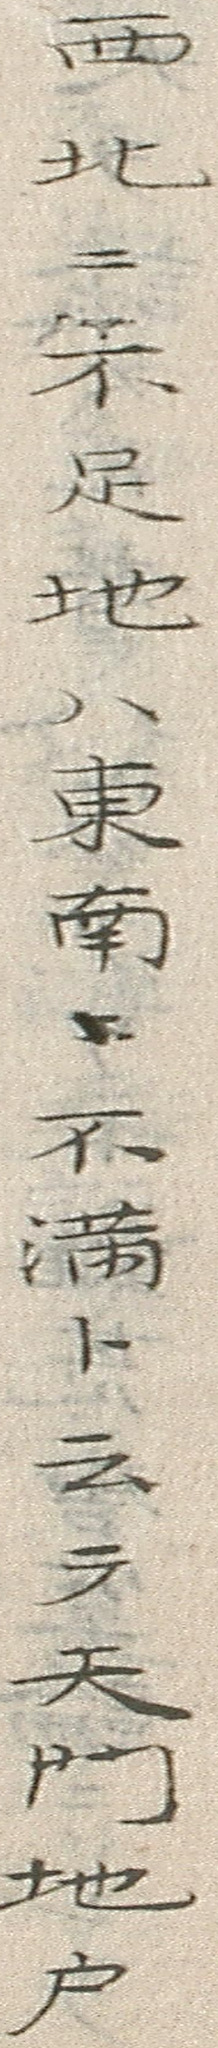西北ニ不足地ハ東南？不満ト云テ天門地戸
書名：天學略名目羽翼　全
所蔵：東京大学地震研究所図書室 Earthquake Research Institute Library, The University of Tokyo, JAPAN
